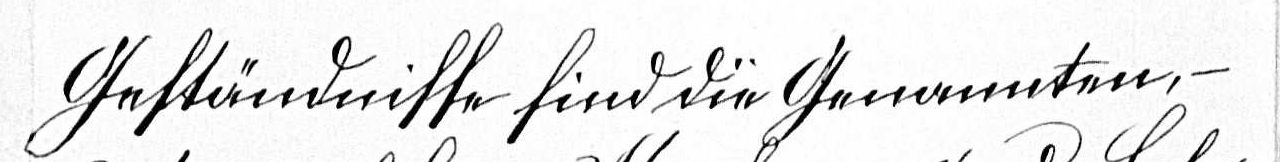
Geständnisse sind die Genannten,-
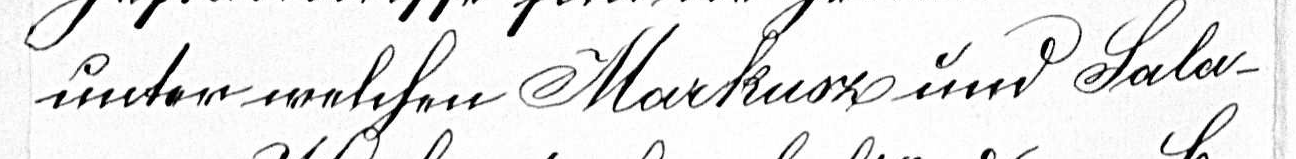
unter welchen Markusz und Sala¬
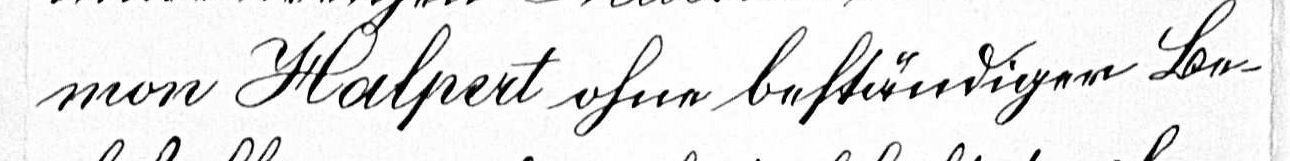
mon Halpert ohne beständiger Be¬
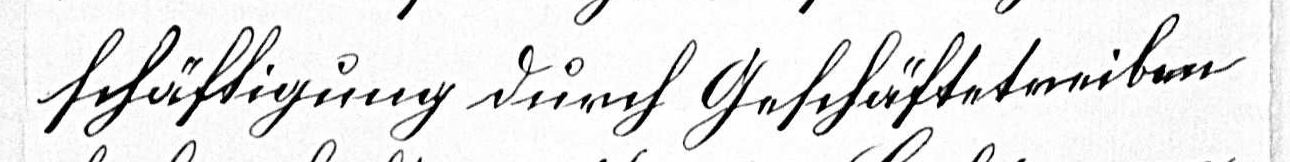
schäftigung durch Geschäftetreiben
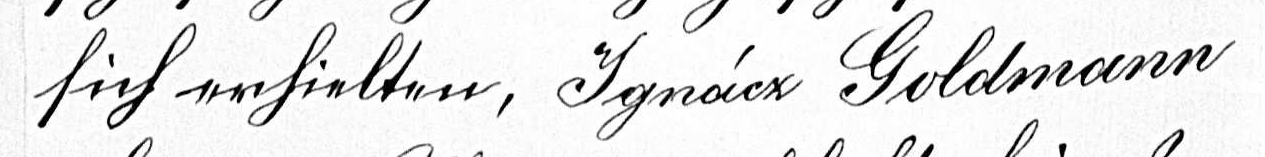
sich erhielten, Ignácz Goldmann
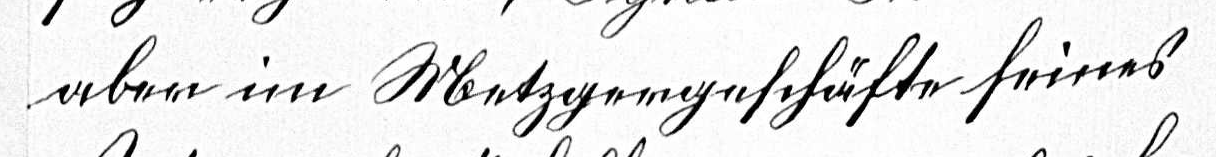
aber im Metzgergeschäfte seines
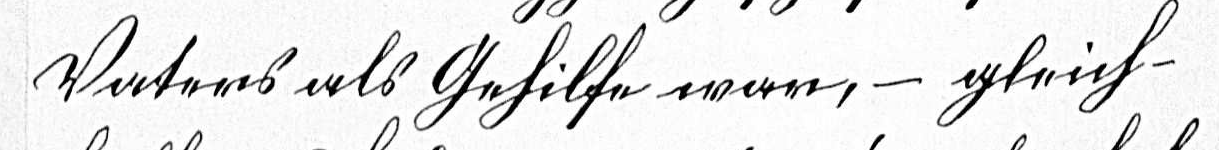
Vaters als Gehilfe war,- gleich¬
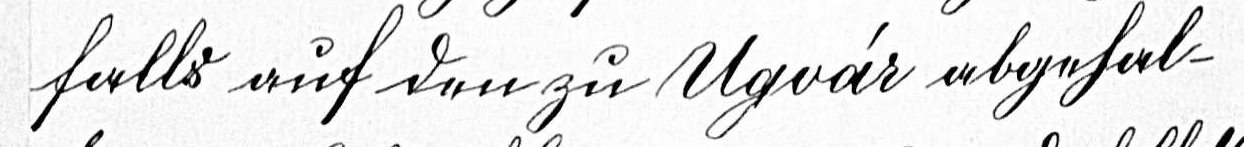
falls auf den zu Ugvár abgehal¬
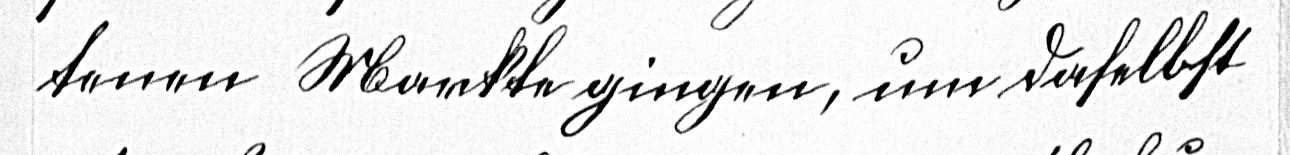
tenen Markte gingen, um daselbst
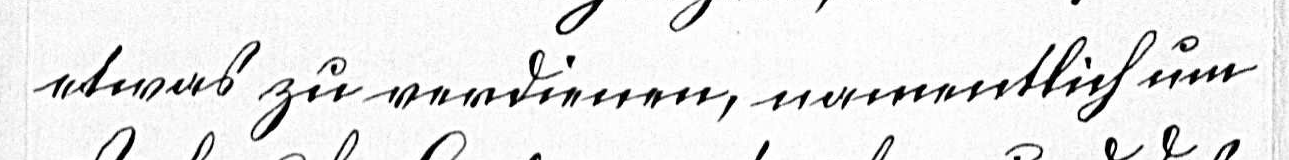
etwas zu verdienen, namentlich um
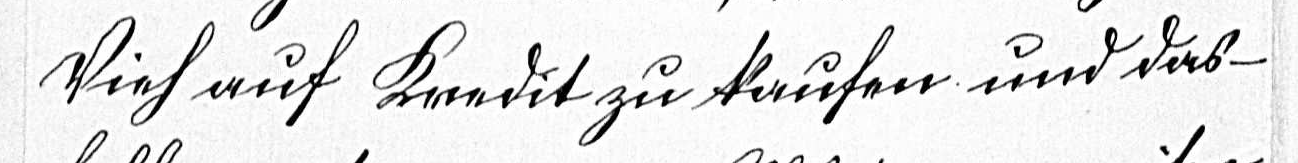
Vieh auf Kredit zu kaufen und das¬
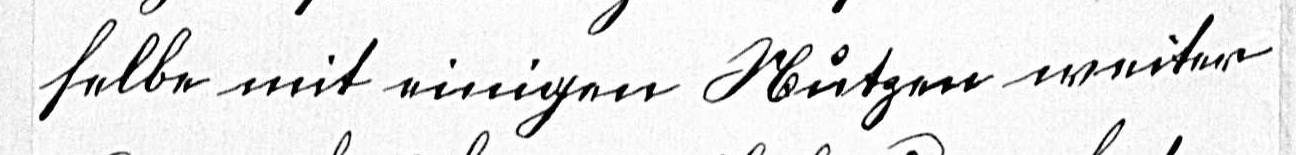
selbe mit einigen Nutzen weiter
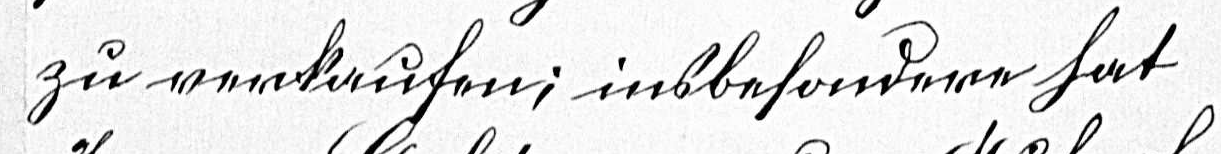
zu verkaufen; insbesondere hat
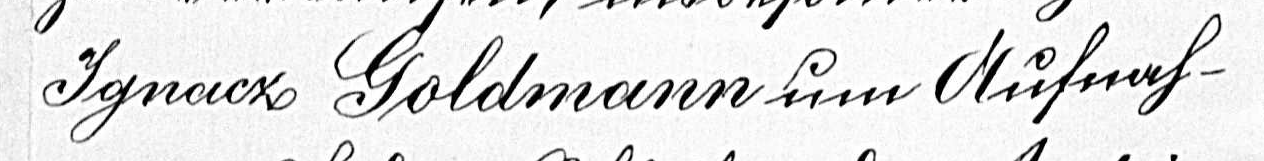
Ignacz Goldmann um Aufnah¬
